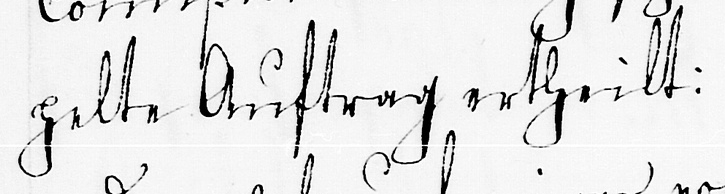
pelte Auftrag ertheilt:
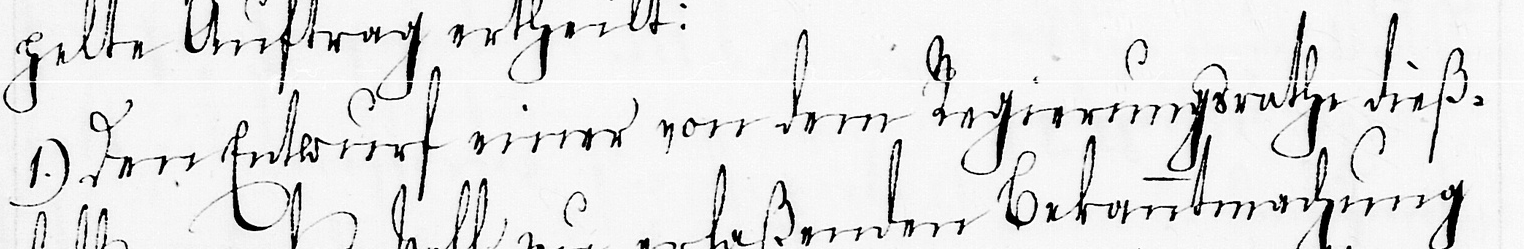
1.) Den Entwurf einer von dem Regierungsrathe dieß¬
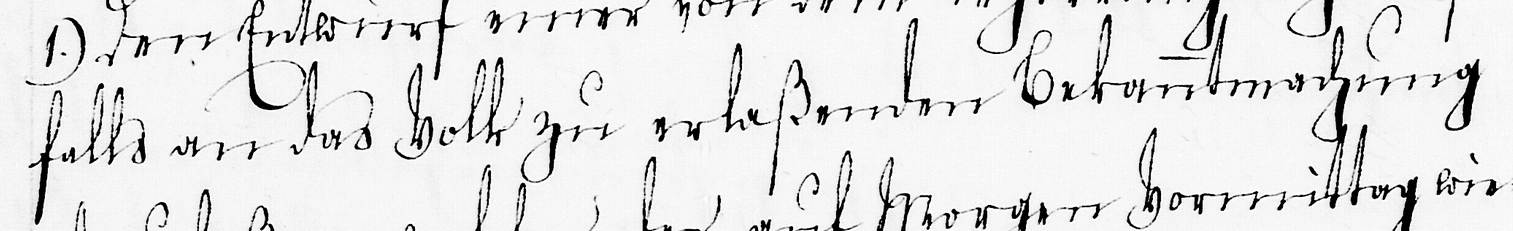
falls an das Volk zu erlaßenden Bekanntmachung
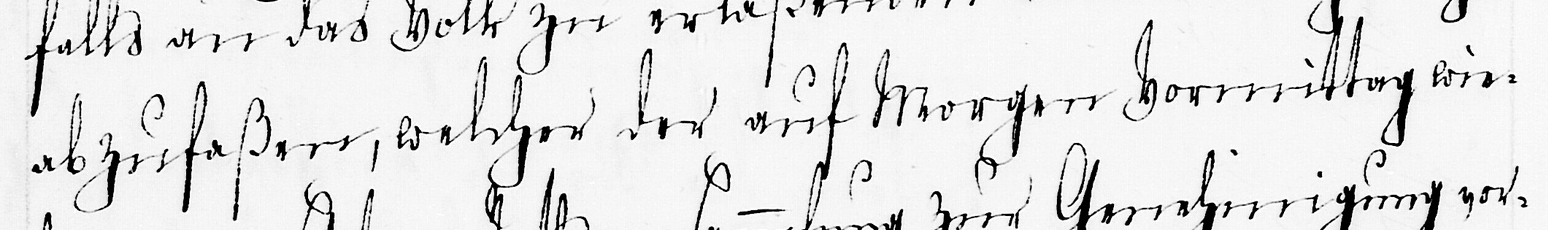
abzufaßen, welcher der auf Morgen Vormittag wie¬
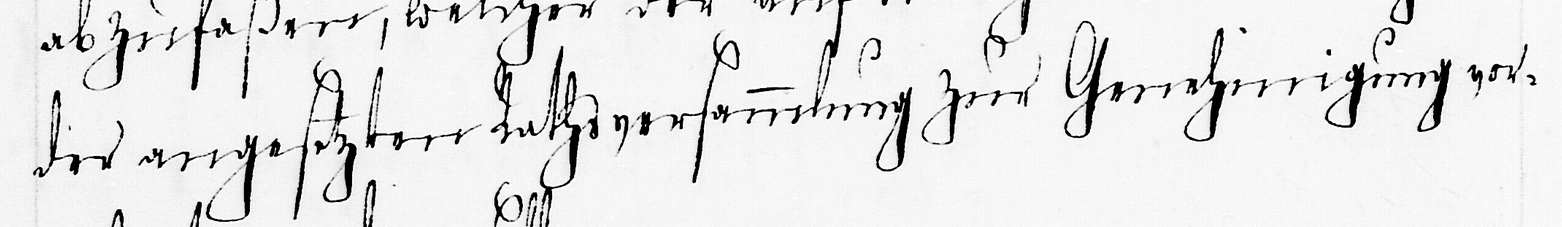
der angesetzten Rathsversammlung zur Genehmigung vor¬
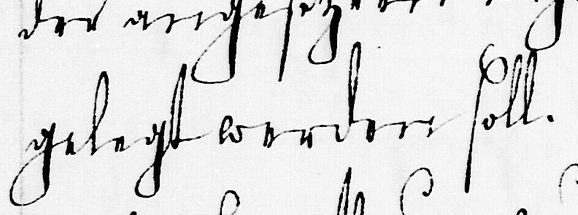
gelegt werden soll.
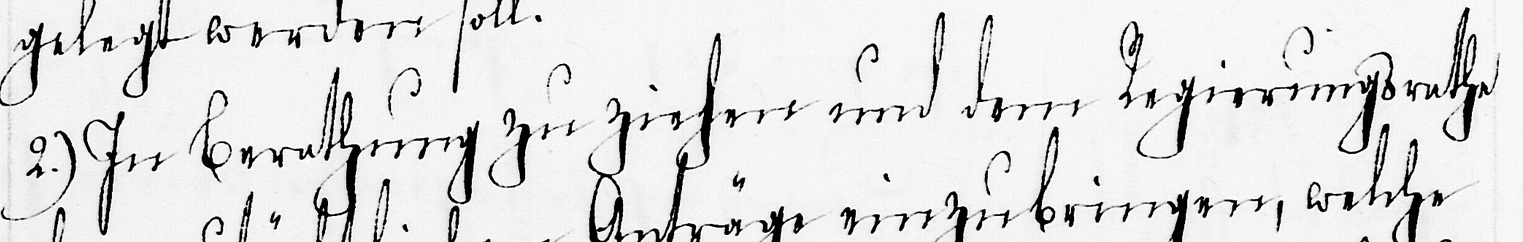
2.) In Berathung zu ziehen und dem Regierungsrathe
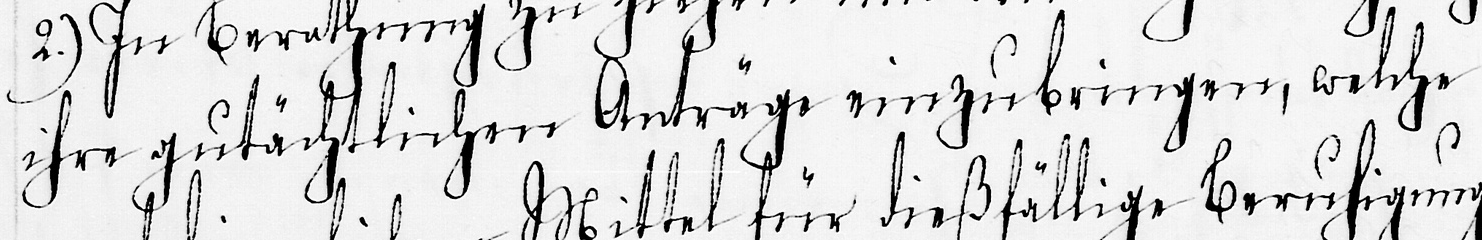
ihre gutächtlichen Anträge einzubringen, welche
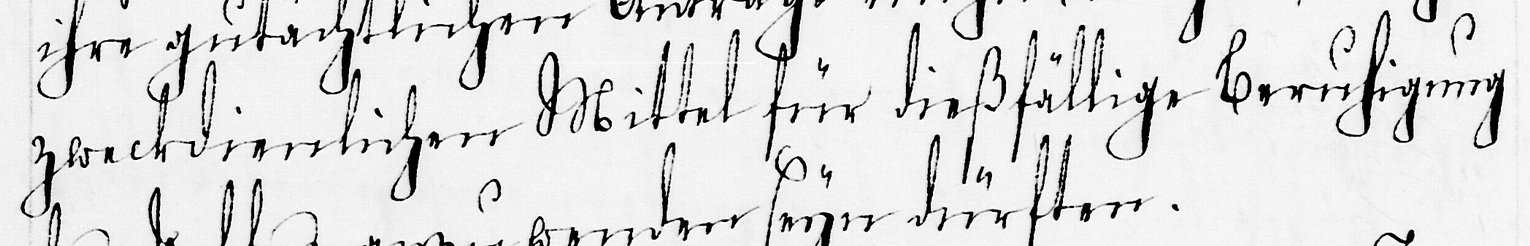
zweckdienlichen Mittel für dießfällige Beruhigung
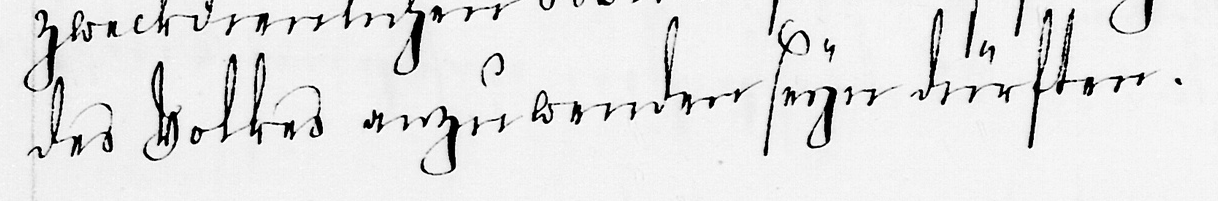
des Volkes anzuwenden seyn dürften.
